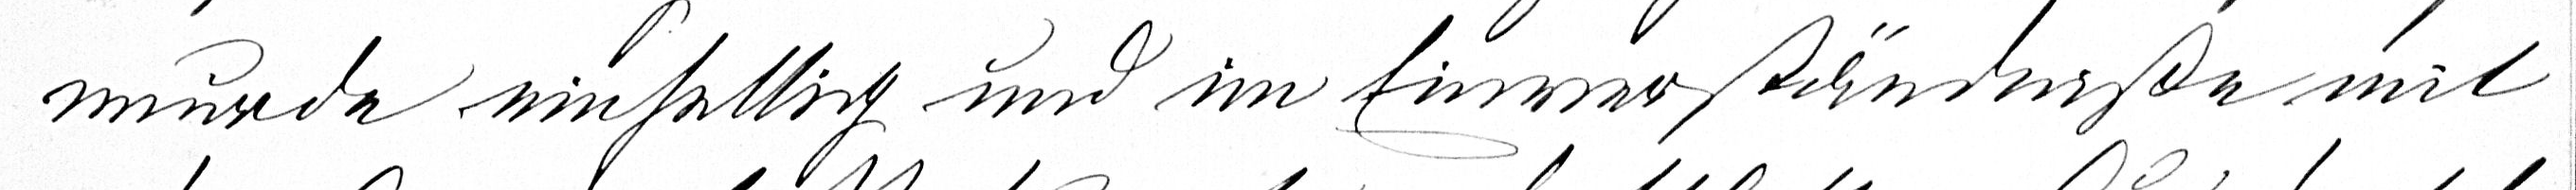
wurde einhellig und im Einverständniße mit
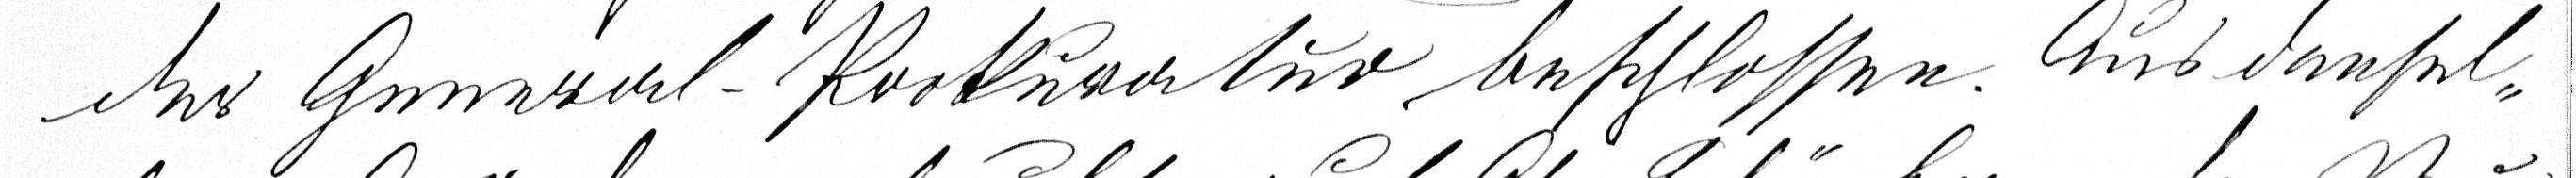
der General-Prokuratur beschlossen. Aus densel¬
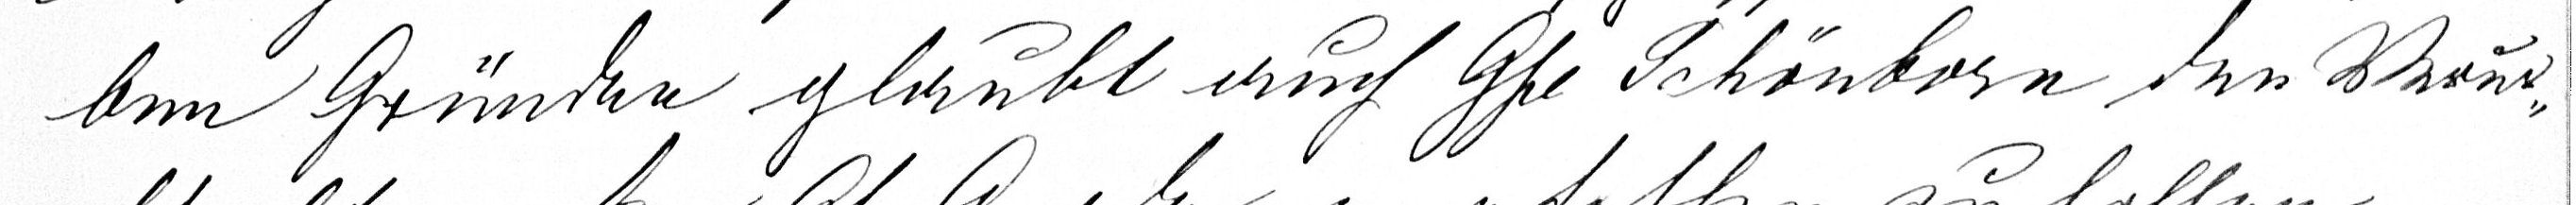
ben Gründen glaubt auch Gxx Schönborn den Verur¬
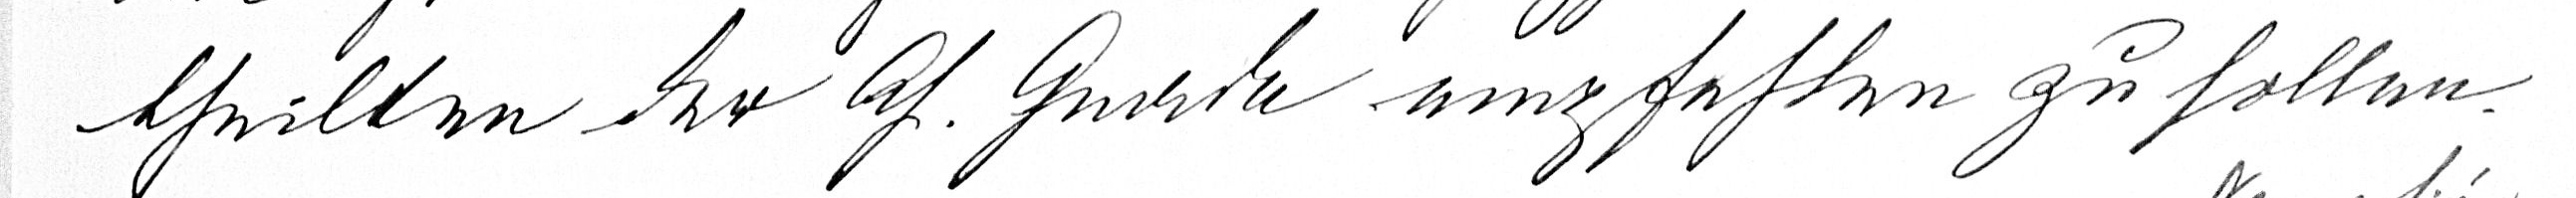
theilten der Ah. Gnade empfehlen zu sollen.
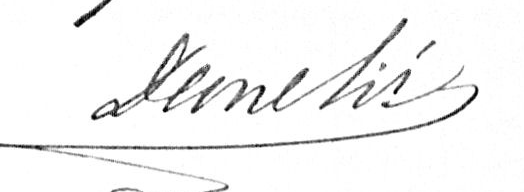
Demelić
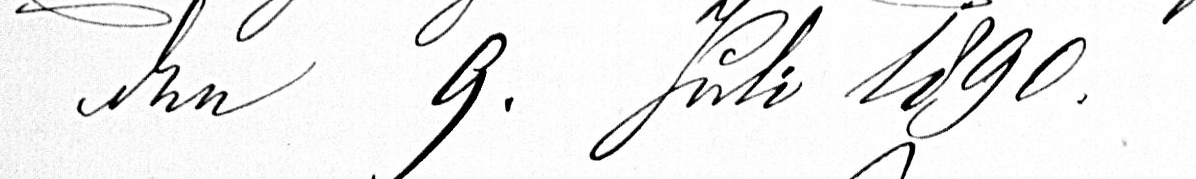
den 9. Juli 1890.
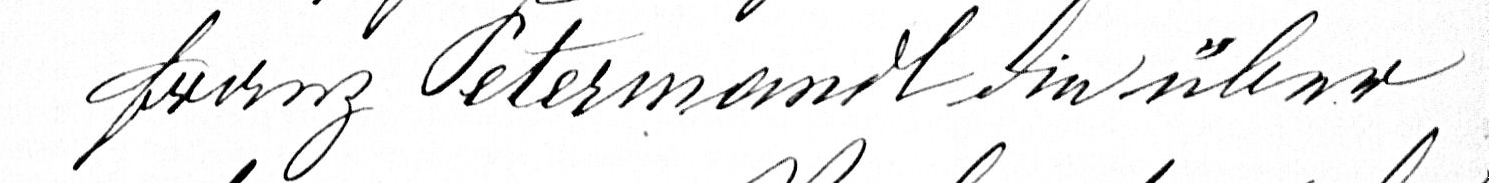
xx
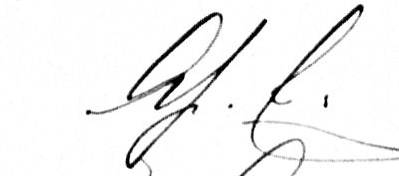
Ah. E.
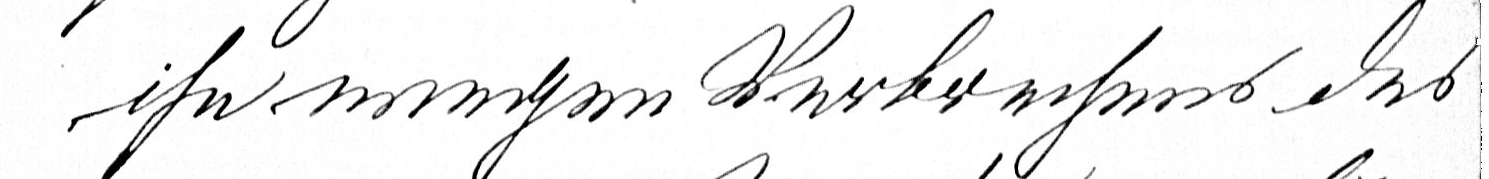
Franz Petermandl die über
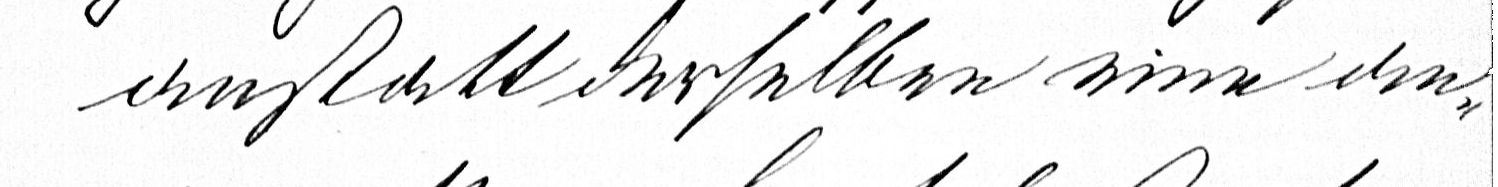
anstatt derselben eine an¬
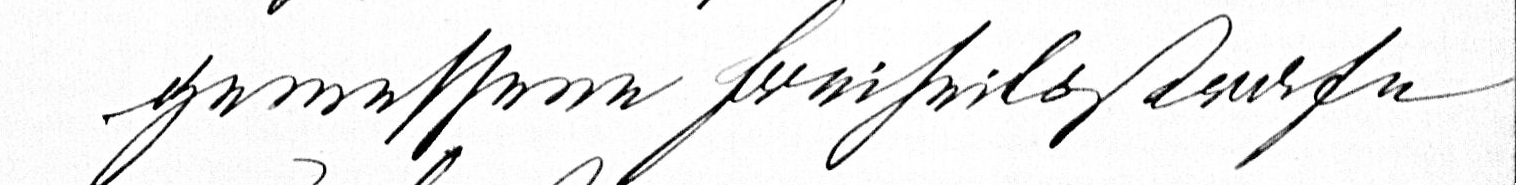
gemessene Freiheitsstrafe
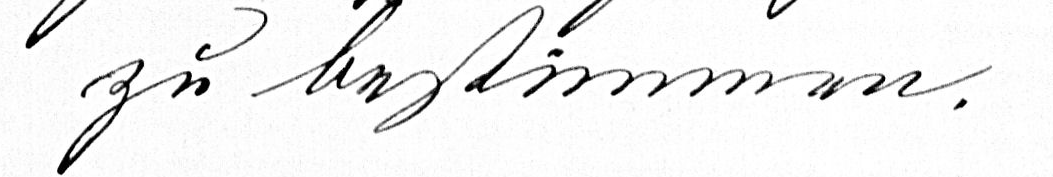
zu bestimmen.
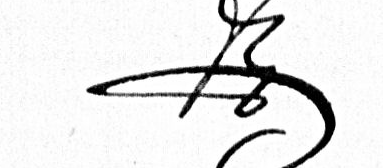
xx
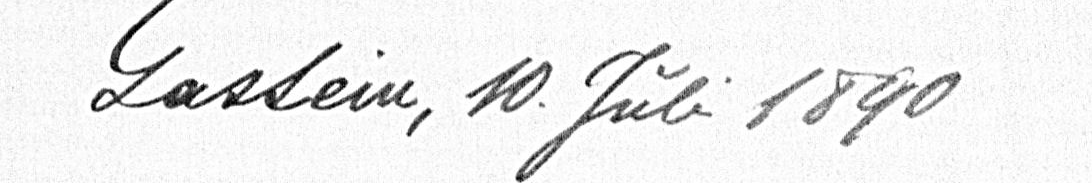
Gastein, 10. Juli 1890
